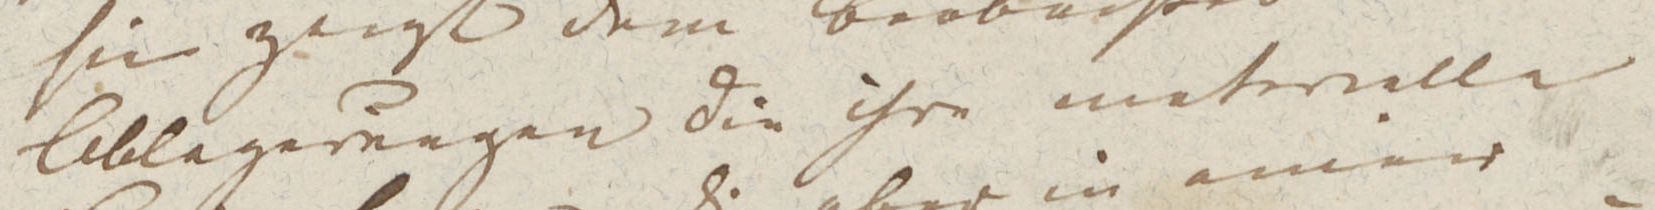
Ablagerungen die ihre materielle
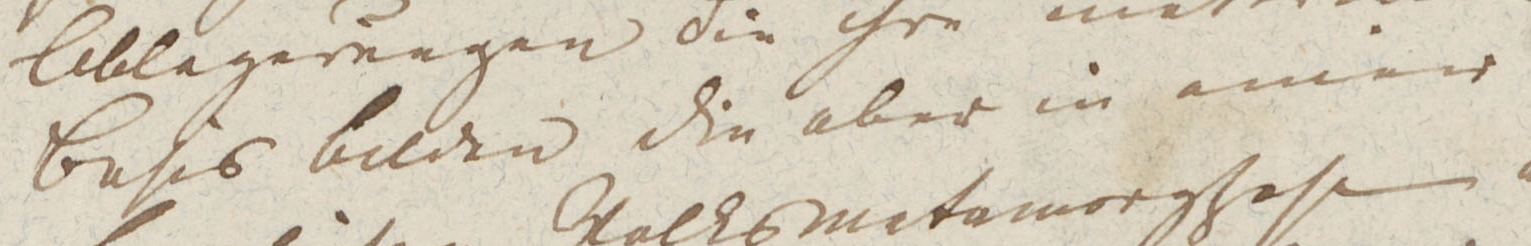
Basis bilden die aber in einer
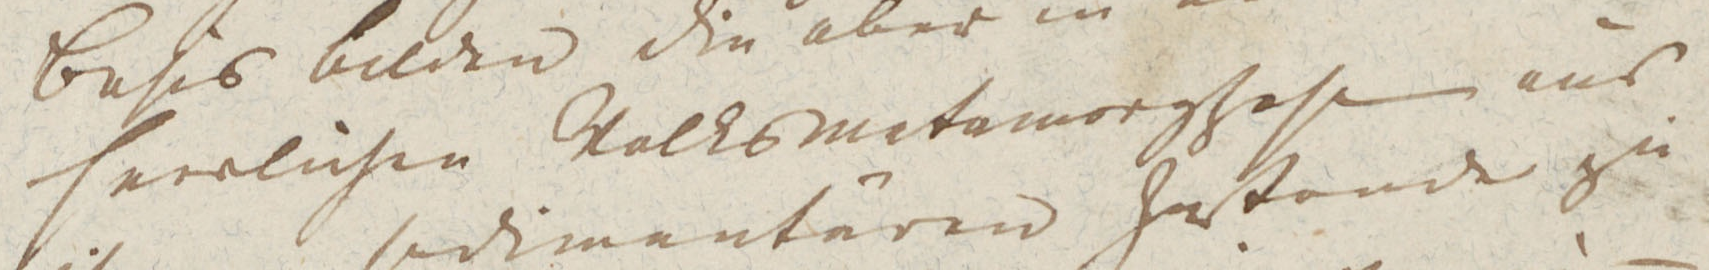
herrlichen Volksmetamorphose aus
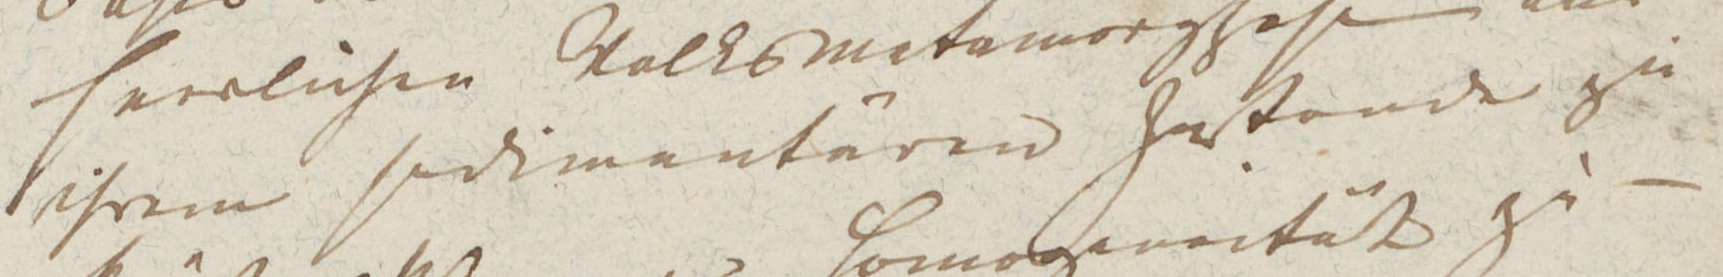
ihrem sedimentären Zustande zu
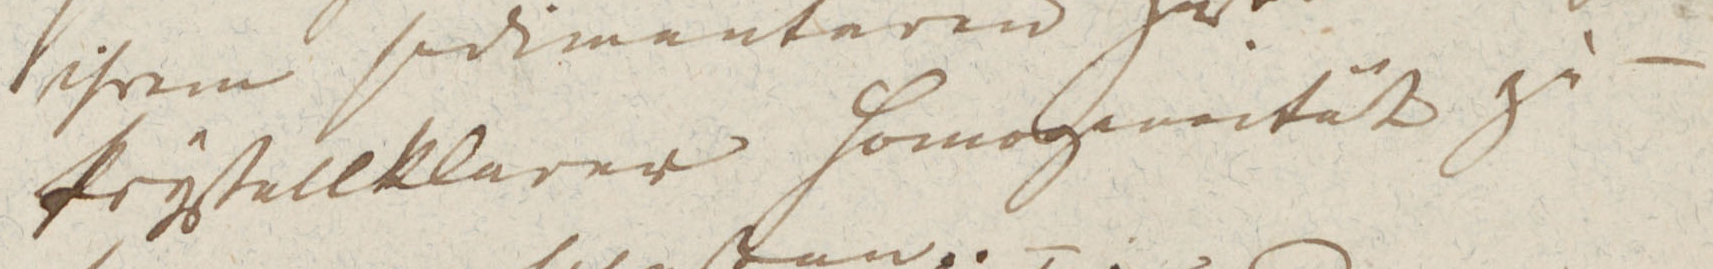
krystallklarer Homogeneität zu-
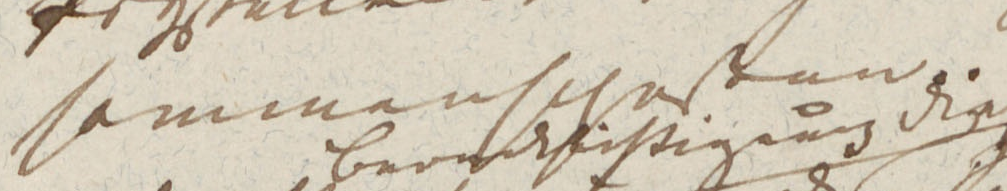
sammenschossen.. –
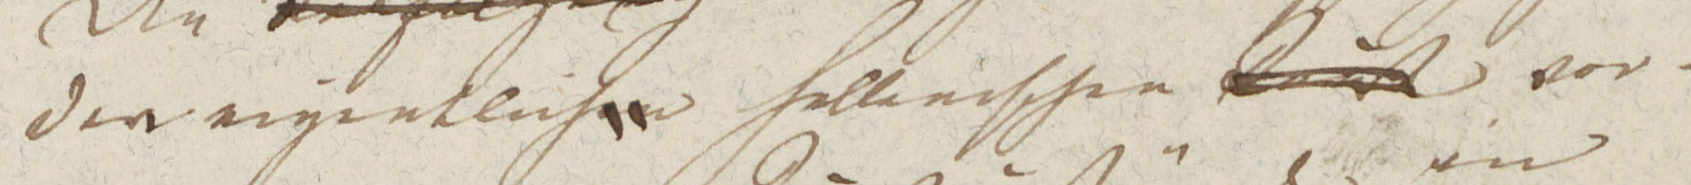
dern eigentlichen Hellenischen Kunst vor-
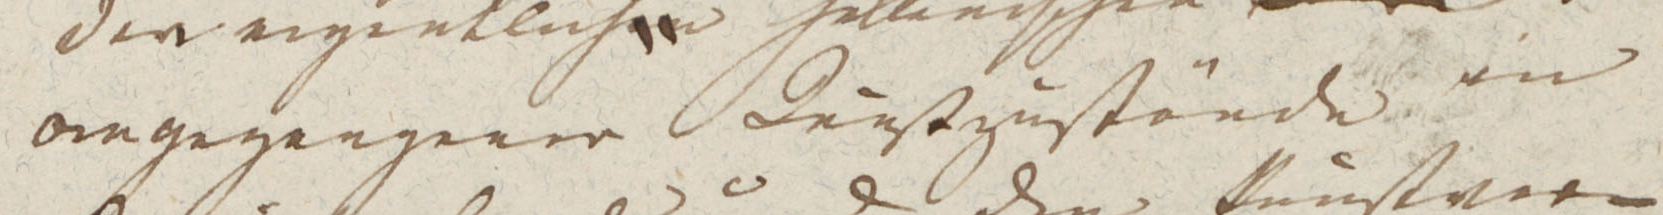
angegangener Kunstzustände in
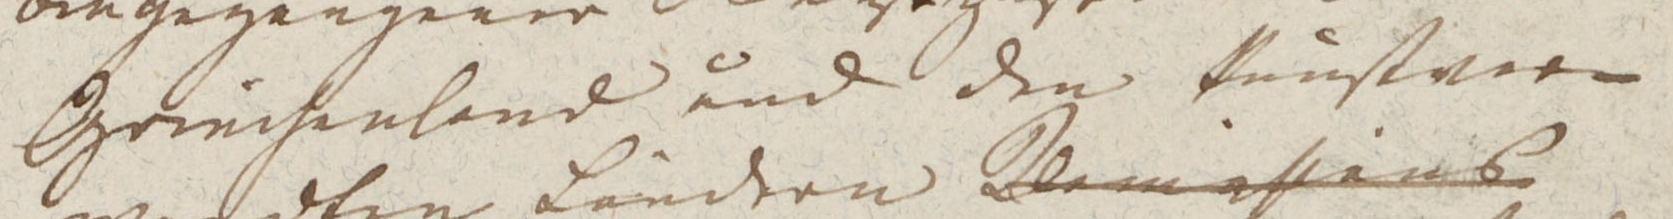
Griechenland und den kunstver-
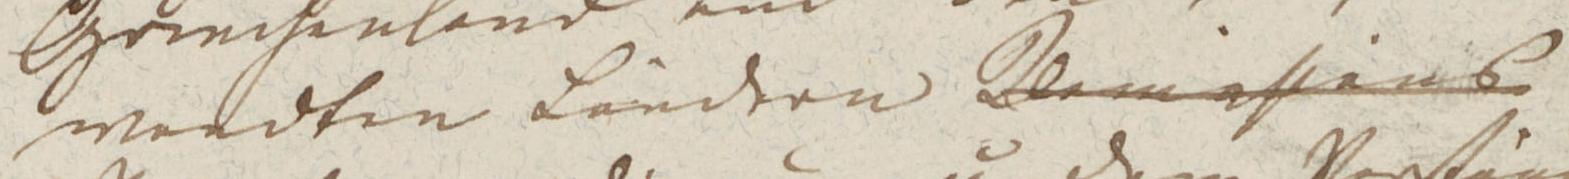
wandten Ländern Kleinasiens
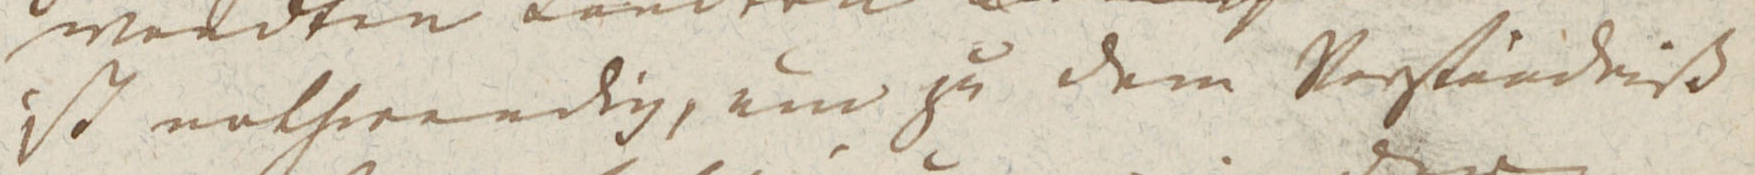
ist nothwendig, um zu dem Verständniss
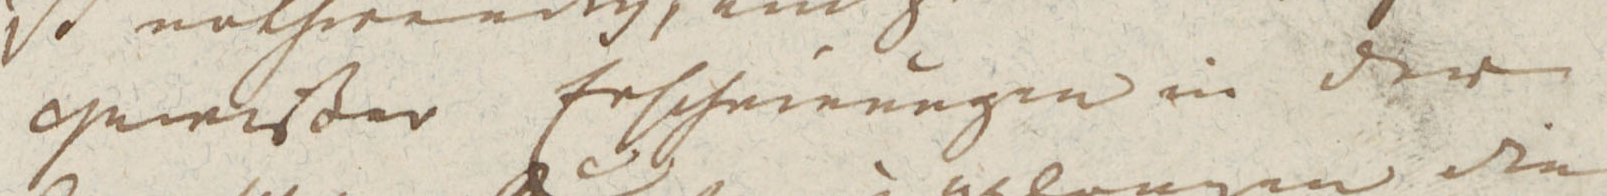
gewisser Erscheinungen in der
